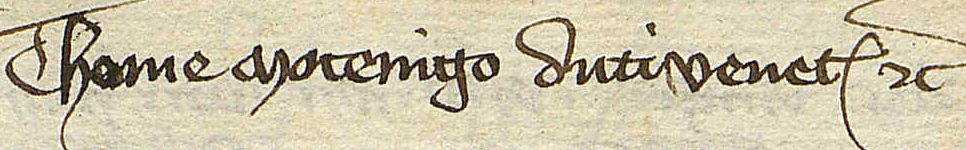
Thome Mocenigo duci venet* ec*
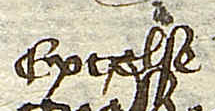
Exelſe
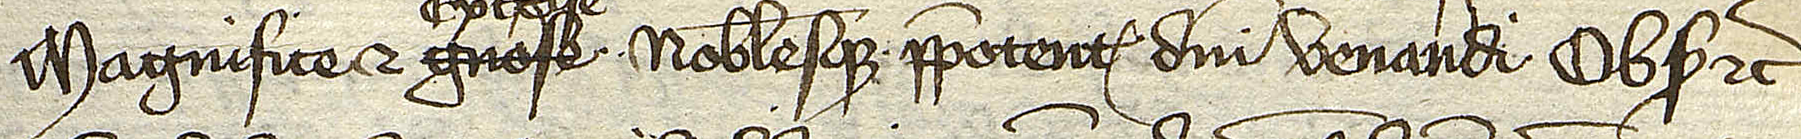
Magnifice @ gnoſe . Nobileſq* p*potent* d*ni ven*andi obſ* ec*
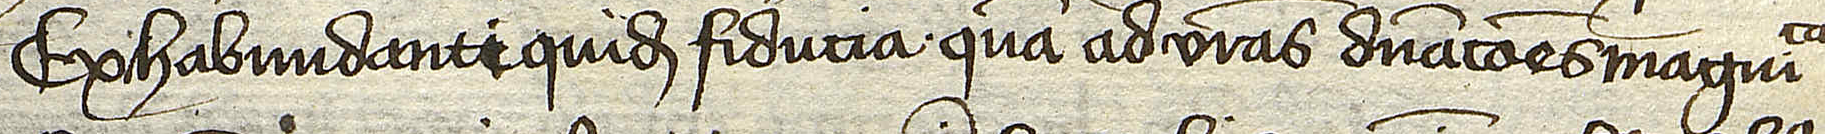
Ex habundanti quid* fiducia . qua* ad v*ras d*nac*o*es magni*
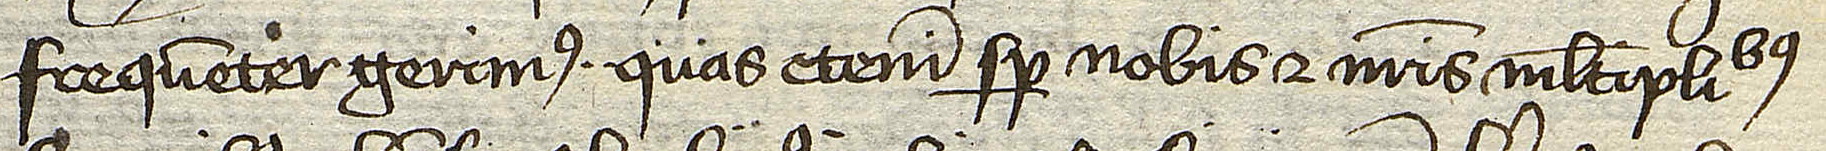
freque*ter gerim* . . quas ete*ni ſ*p* nobis @ n*ris m*ltipli*b*
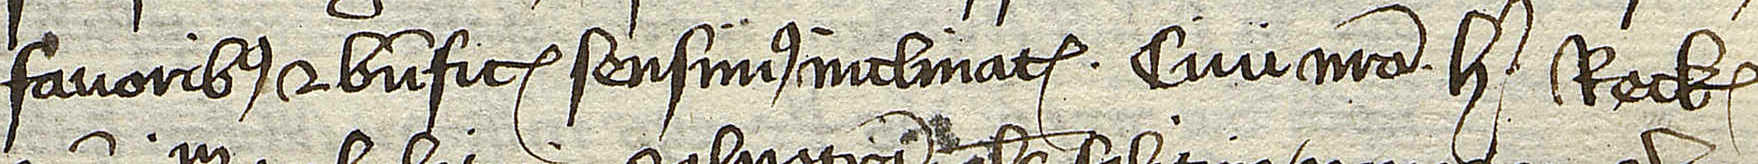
fauorib* @ b*nefic* ſenſim* inclinatas . Ciui n*ro . H* . Reck*
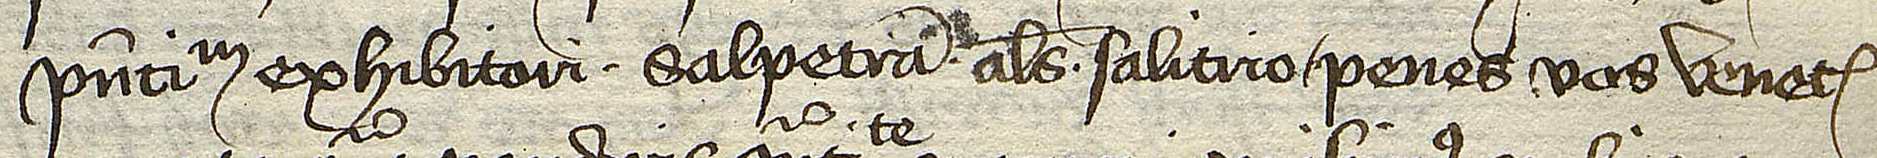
p*nti*m exhibitori . Salpetra* . al*s . ſalitrio / penes vos Venet*
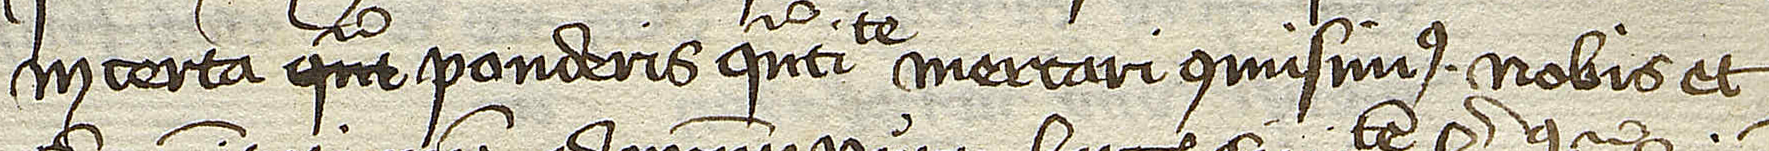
in certa qnt* ponderis q*nti* mercari *miſim* . nobis et
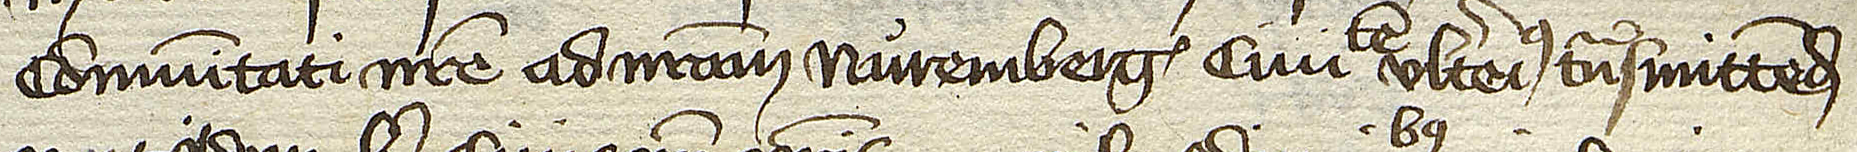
Com*nitati n*re ad n*ram Nuremberg* Ciui* vlte*i* t*nſmitte*d*
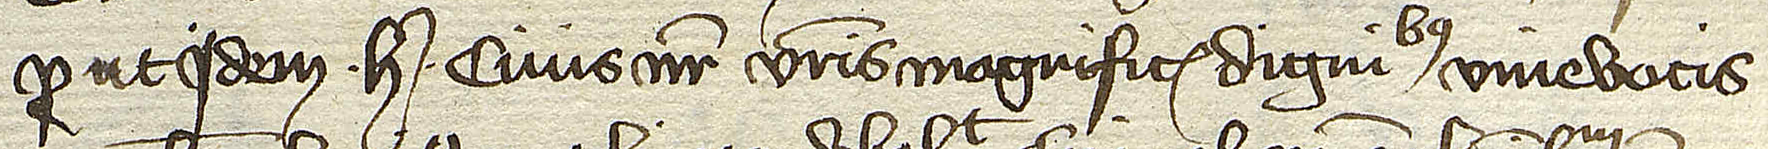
p*ut Idem . H* . Ciuis n*r v*ris magnific* digni*b* viue vocis
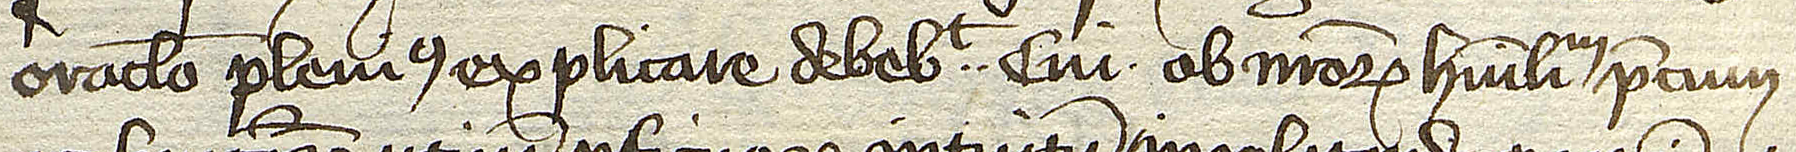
orac*lo pleni* explicare debeb* . . Cui . obn*ro* hu*ili*m p*cum
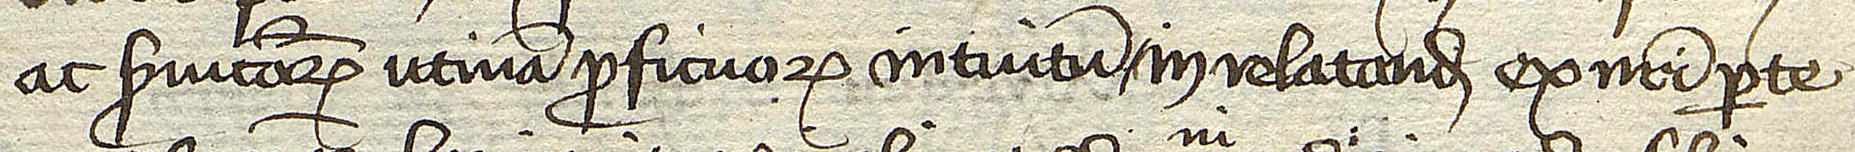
ac ſ*uic*or* utina* p*ficuor* intuitu* / in relatand* ex n*ri p*te
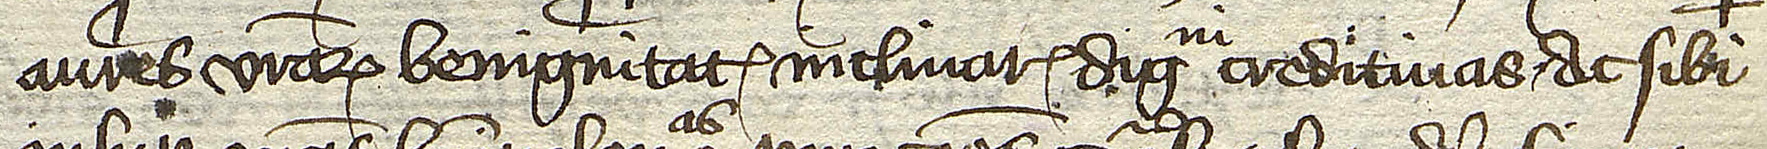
aures v*rar* benignitat* inclinar* dig* creditiuas / Ac ſibi
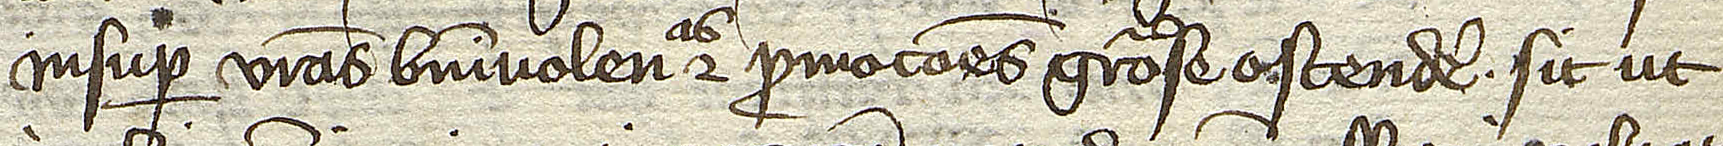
inſup* v*ras b*niuolen* @ p*moc*o*es g*roſe oſtende* . ſic ut
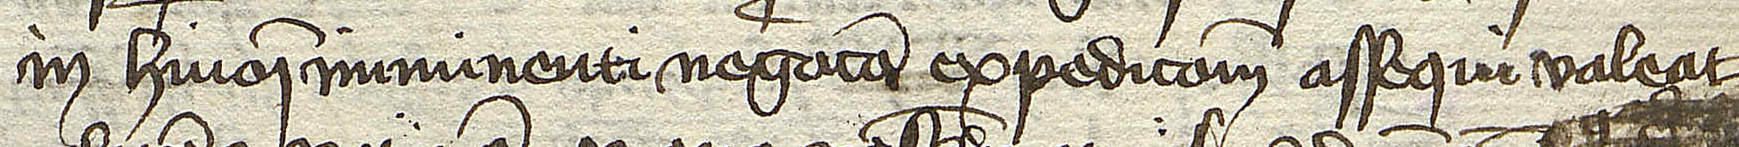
in h*iu*i imminenti negoc*o expedicio*m aſſequi valeat
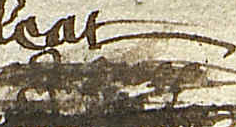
%%%%%%
